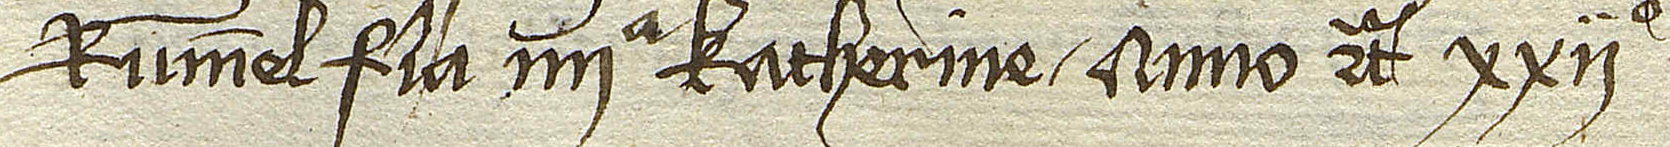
Rumel* fi*a iiii* katherine / Anno ec* xxii*
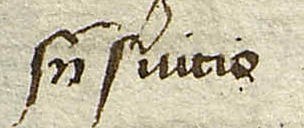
ſn* ſ*uicio
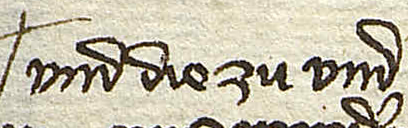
vnd die ʒu vnd
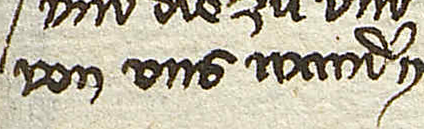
von vns wand*n
